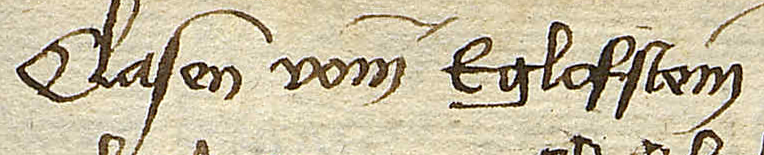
Claſen vom* Eglofſtein
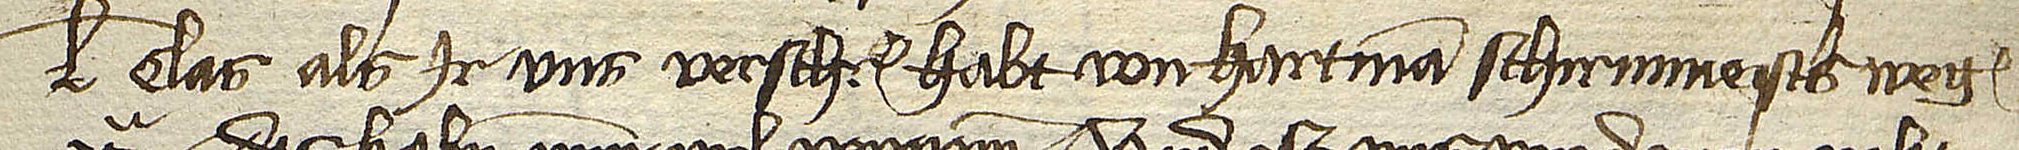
L* Clas als Ir vns verſchr* habt von hartma* ſchirmmeiſt*s weg*
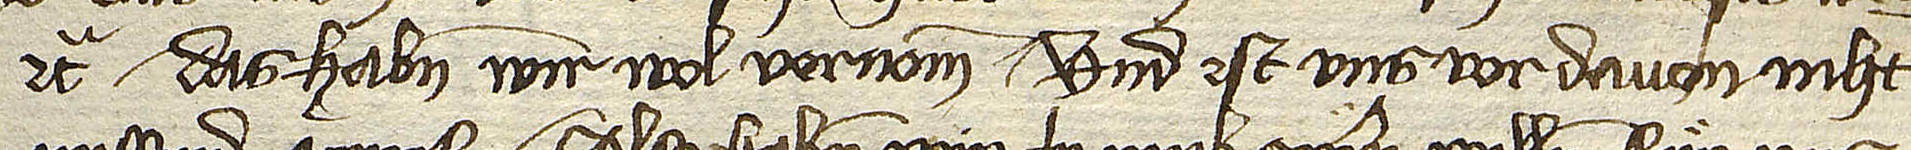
ec* / Das habn* wir wol vernom* / Vnd iſt vns vor dauon niht
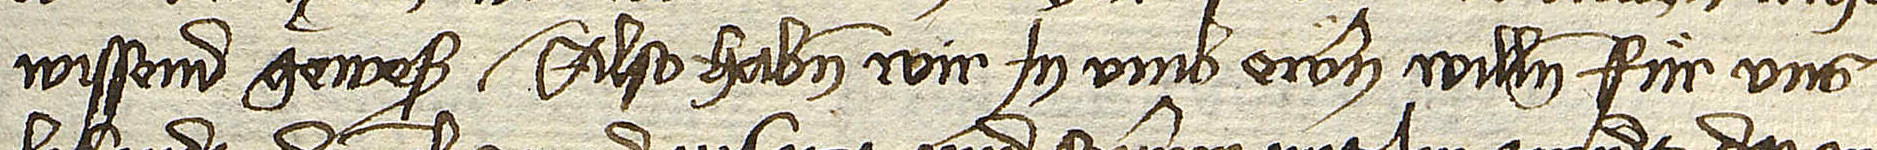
wiſſend geweſ* / Alſo habn* wir In vmb eẅ*n willn* für vns
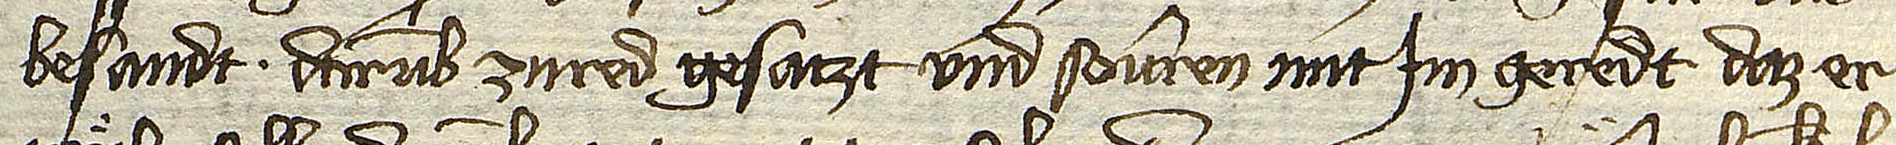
beſandt . darub* ʒured geſacʒt vnd ſou*ren mit Im geredt daʒ er
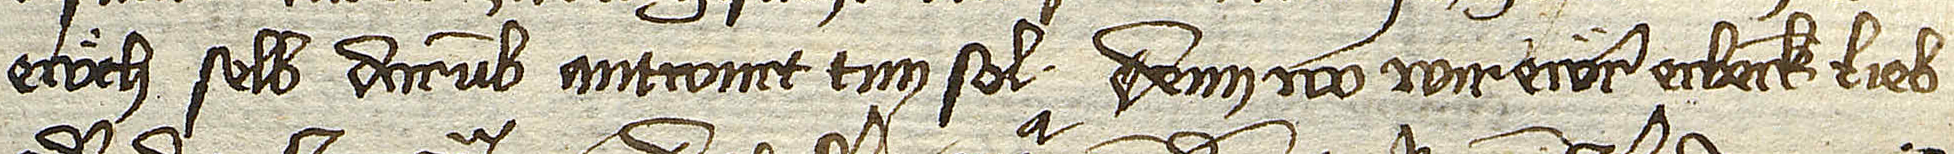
eẅch ſelb darub* antwurt tun ſol . Denn wo wir eẅr* erberk* lieb
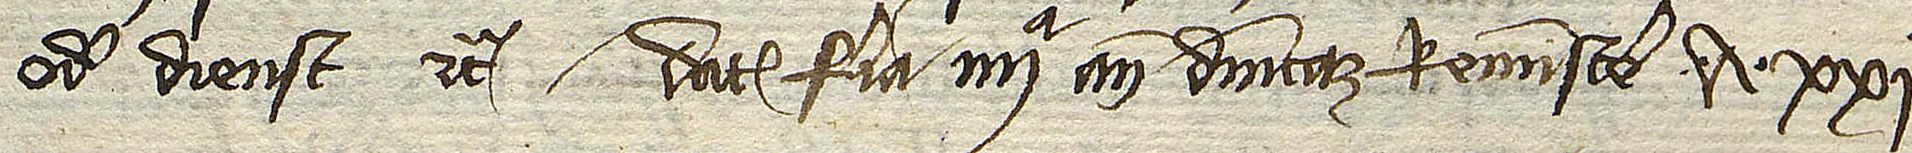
od* dienſt ec* / Dat* fi*a iiii* an* d*nica* Remi*ſce* A* xxi*
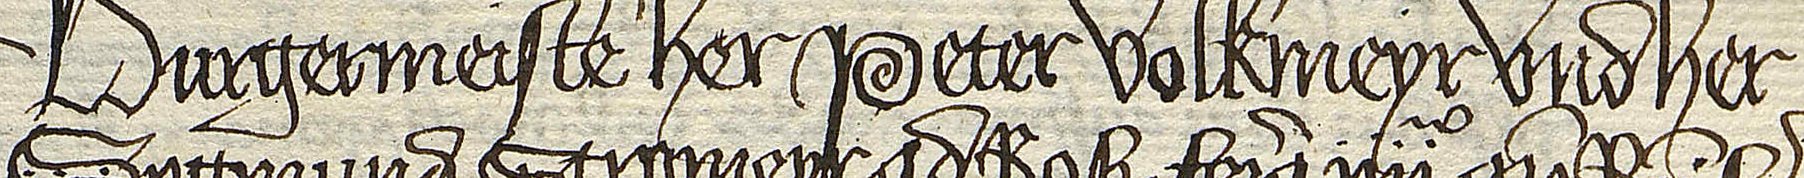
Burgermeiſte* her Peter Volkmeyr Vnd her
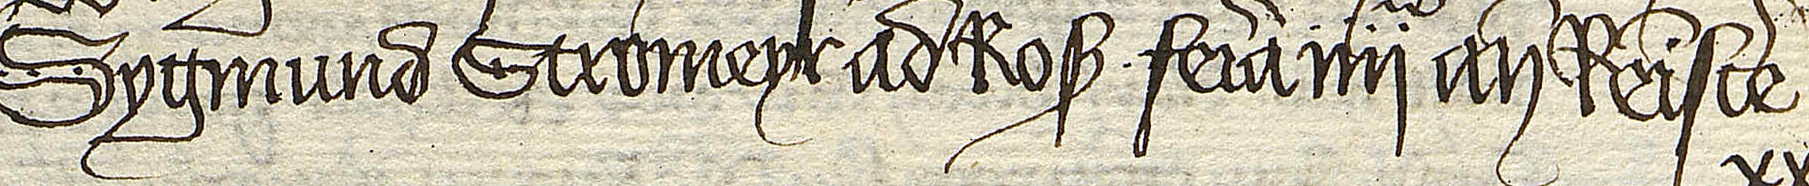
Symund Stromeyr ad Roſ* . fei*a iiii* an* Re*iſce*
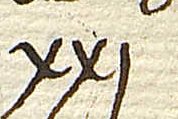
xxi*
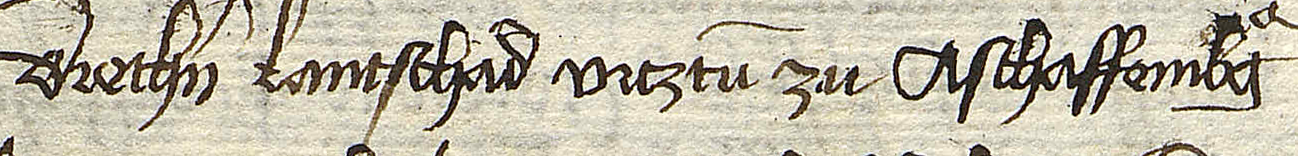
Diethn* lantſchad vicʒtu* ʒu Aſchaffemb*g
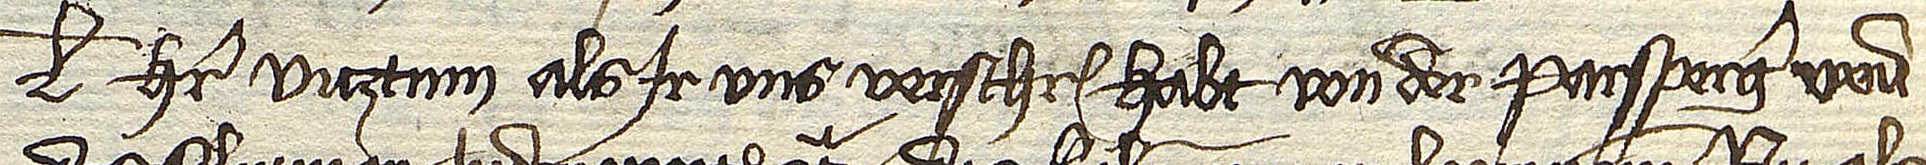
L* hr* vicʒtum als Ir vns verſchr* habt von der Parſperg* vnd
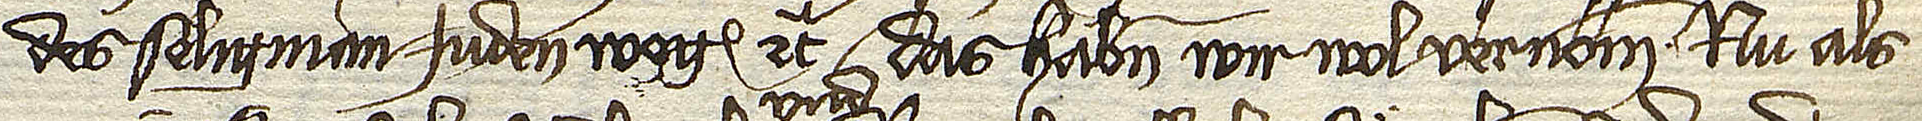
des ſeligman Iuden weg* ec* / das habn* wir wol vernom* . Nu als
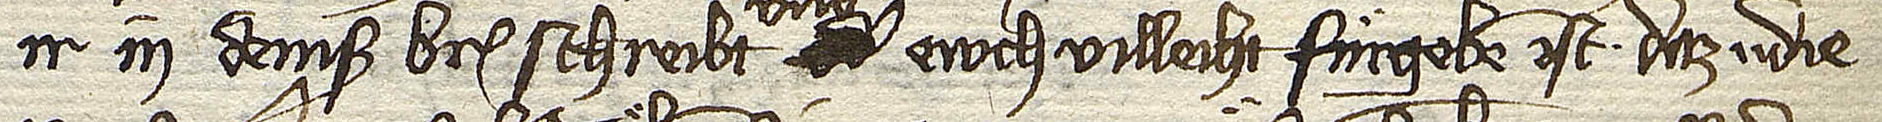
ir in demſ* br* ſchreibt od* ewch villeiht fürgebe* iſt . daʒ ~ die
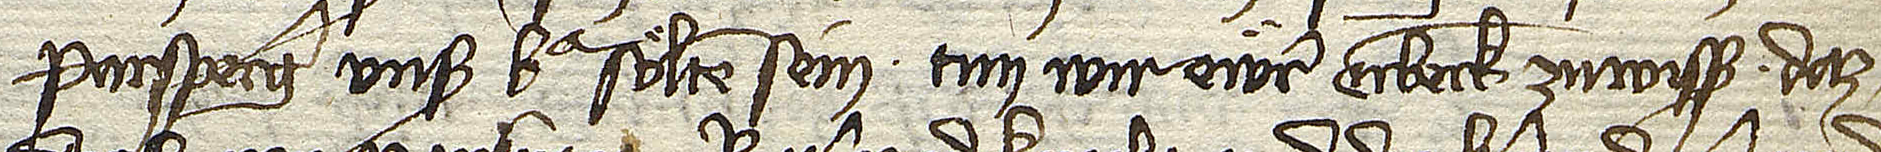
Parſperg* vnſ* b* ſölte* ſein . tun wir eẅr* erberk* ʒuwiſſ* . daʒ
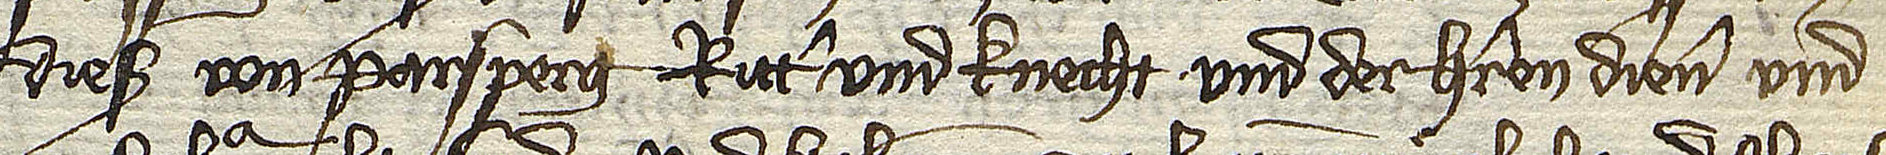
dieſ* von Parſperg Ritt* vnd knecht . vnd der h*ren dien* vnd
